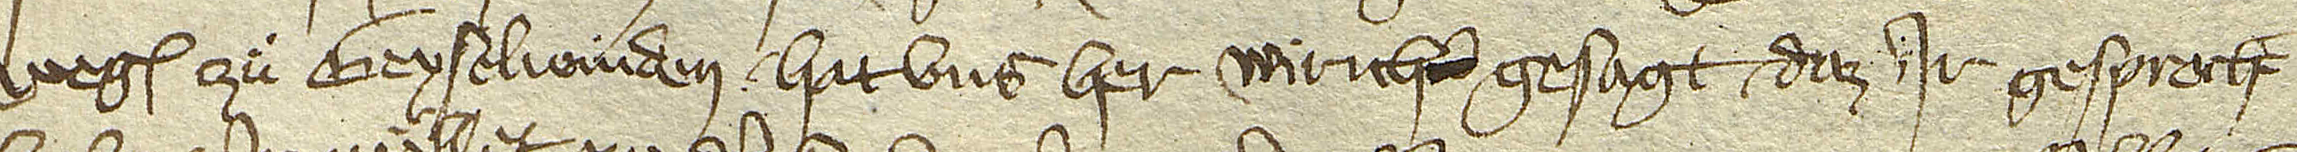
weg* cʒü Geyſelwinden / hat vns her wirichn* geſagt / daʒ Ir geſproche*
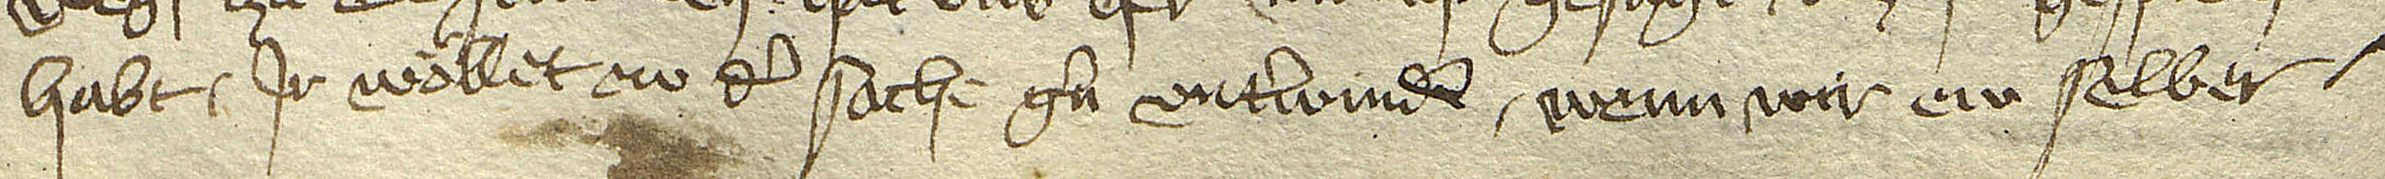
habt / Ir wöllet ew d* ſache g*n vnt*winde* / wenn wir ew ſelber /
